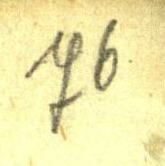76
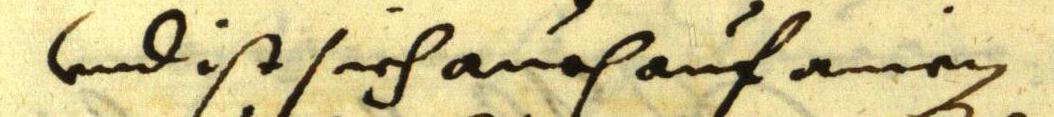vnd ist sich aūch aūf ainen
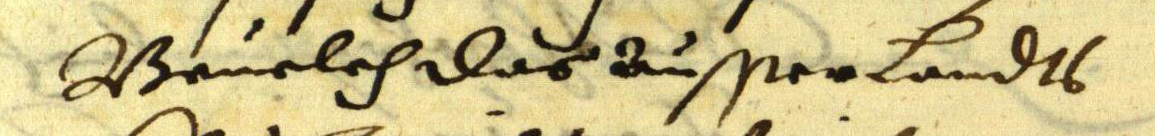Beūelch das Aūsser Landts
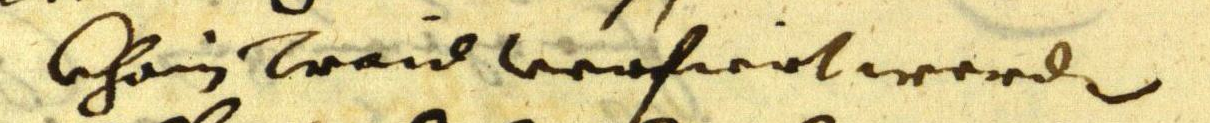khain Traid verfiert werd
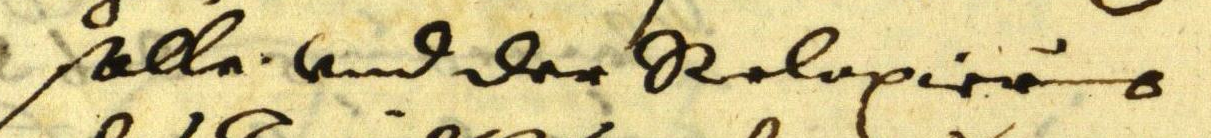solle. vnd der Relaxierūng
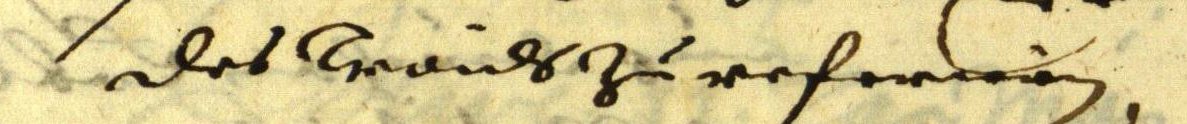des Traids Zū referiern,
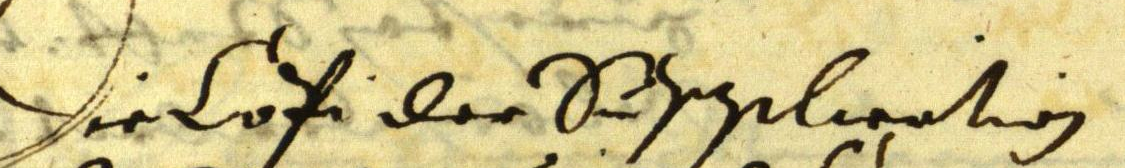Die CoPi der Sūpplication
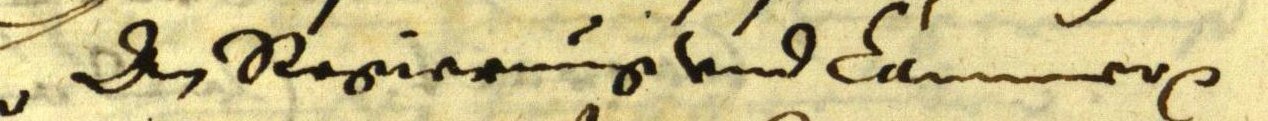An Regierūng vnd Cammer etc
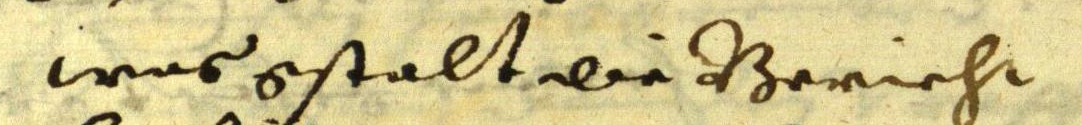was gestalt die Bericht
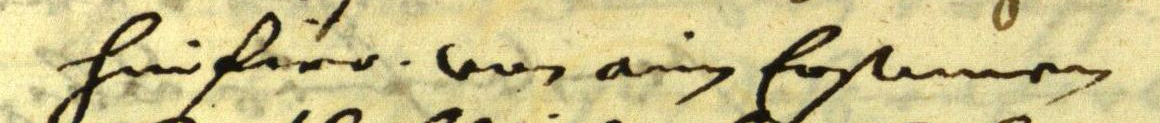hinfiro. von aim Ersamen
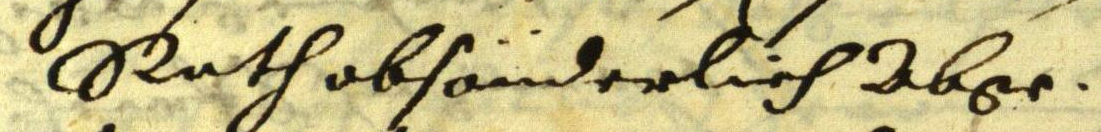Rath obsönderlich Abge¬
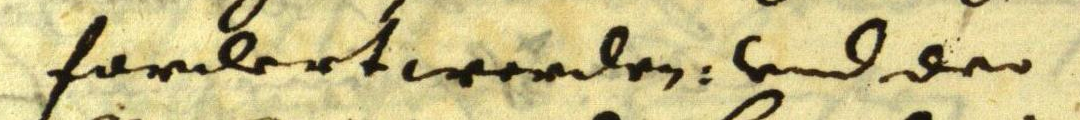fordert werden: vnd der
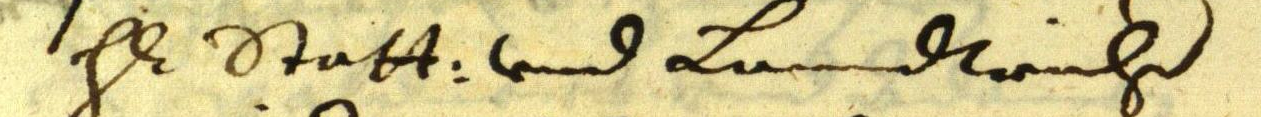hl Statt: vnd Lanndtricht
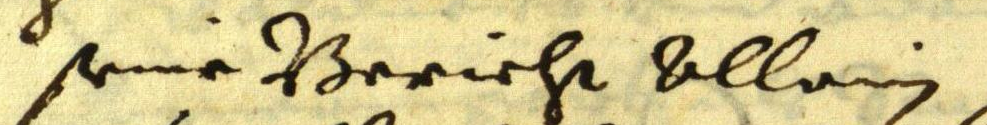seine Bericht Allain
